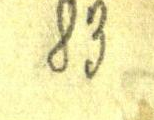83
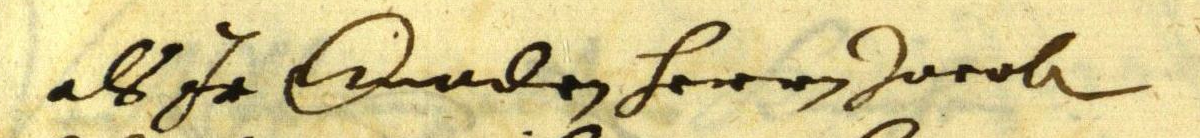als Ir Gnaden herrn Jacob
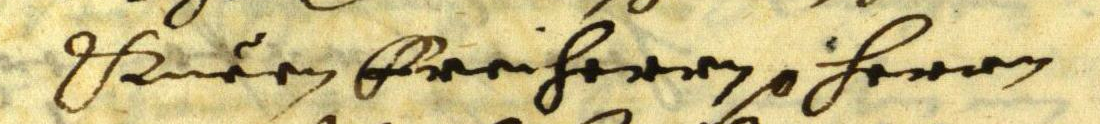Kūeen Freiherrn etc herrn
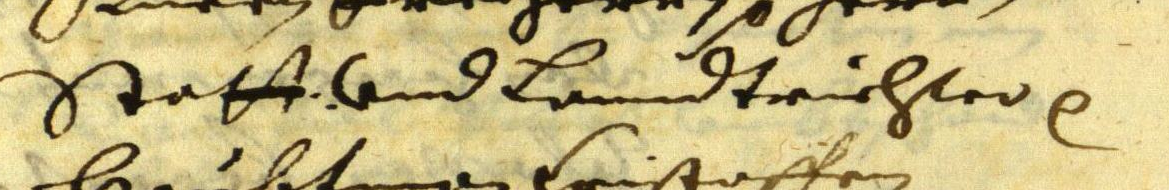Statt: vnd Lanndtrichter etc
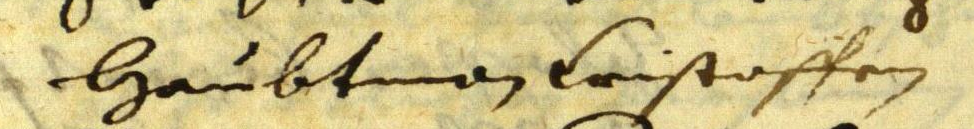Haūbtman Cristoffen
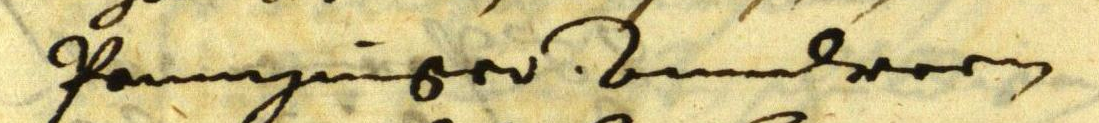Pennzinger. Anndreen
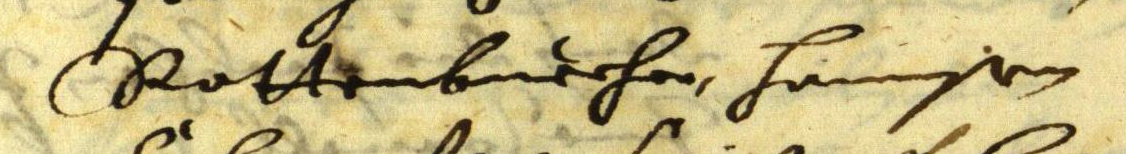Rottenbūecher, hannsen
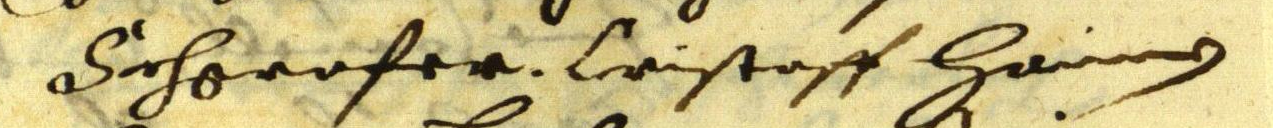Schgrafer. Cristoff Haimen
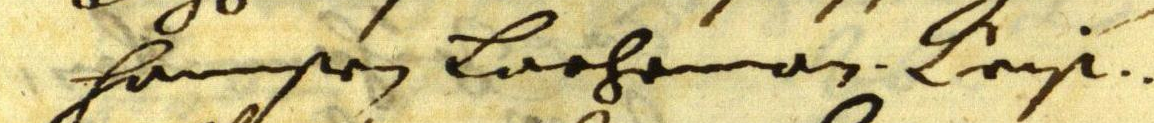hannsen Locheman. Crist¬
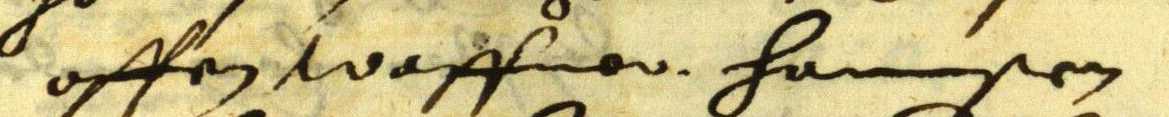offen Waffner. hannsen
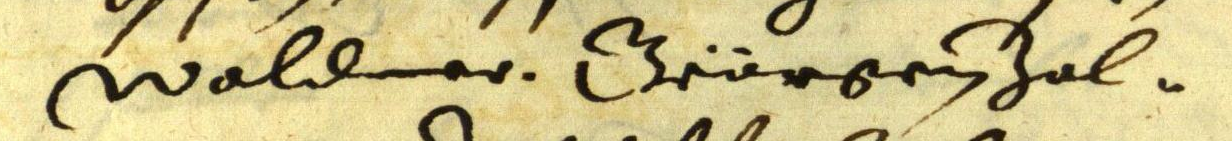Waldner. Geörgen Zal¬
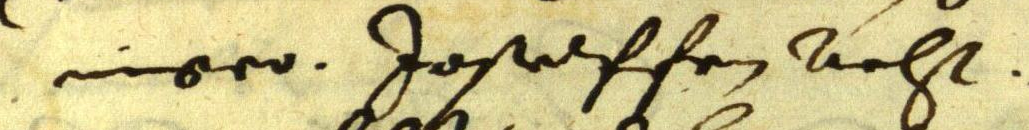inger. Joseffen Acht¬
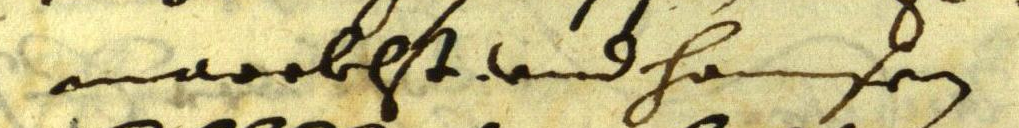marckht. vnd hannsen
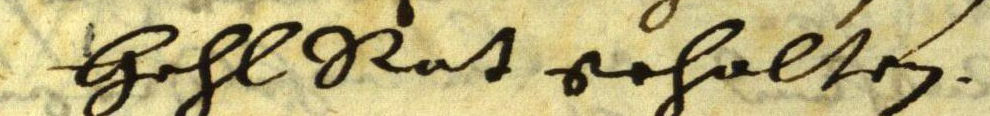Hehl Rat gehalten.
